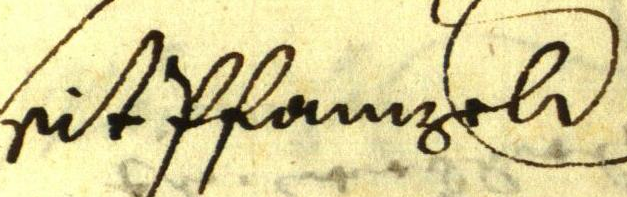Veit Pfanzelt
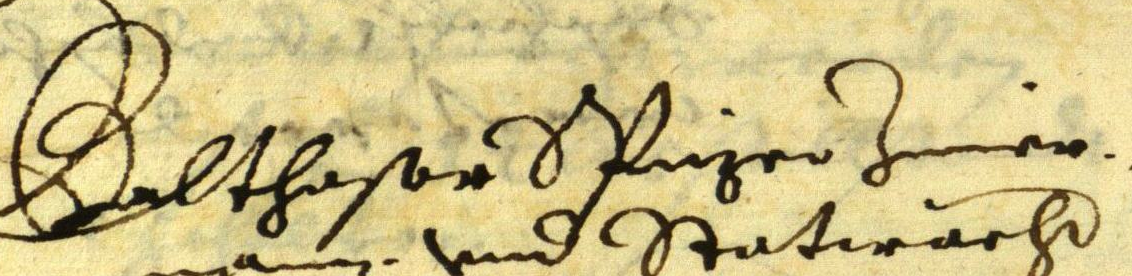Balthasar Spizer Zimer¬
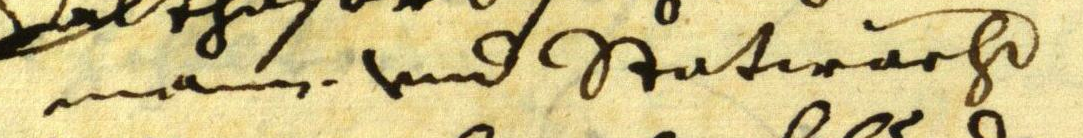mann. vnd Statwacht
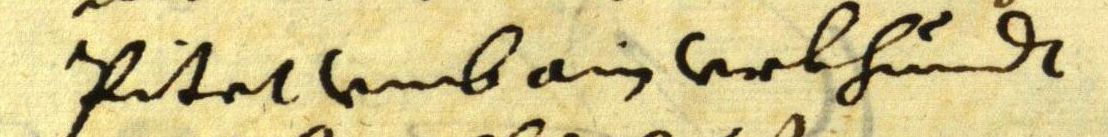Pitet vmb ain vrkhūndt
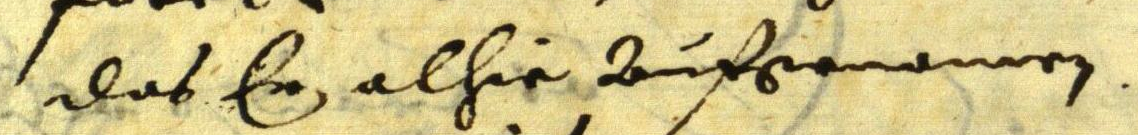das Er alhie Aūfgenomen.
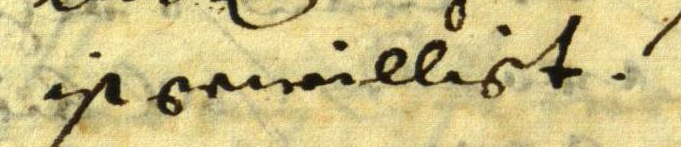ist gewilligt.
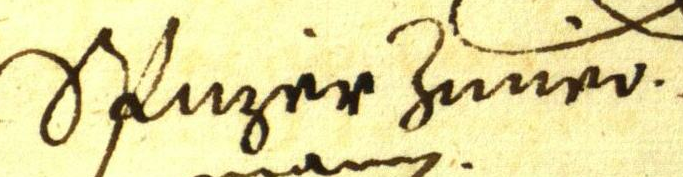SPizer Zimer¬
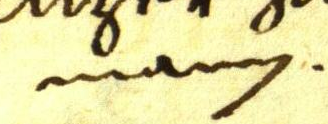mann.
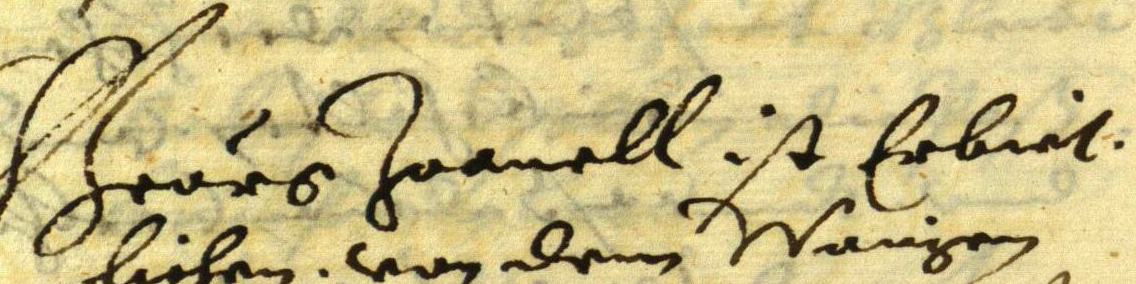Geōrg Zoanelln ist Erbiet¬
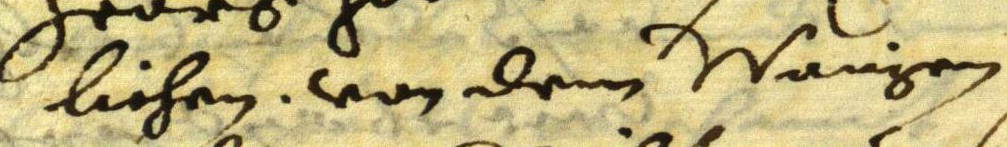lichen. von dem Waizen
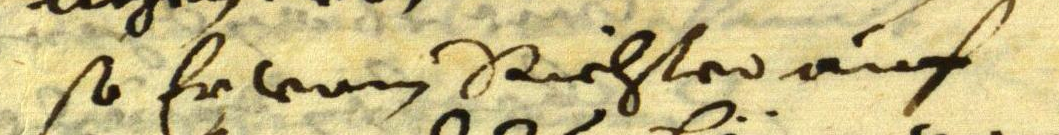so Er vom Richter aūf
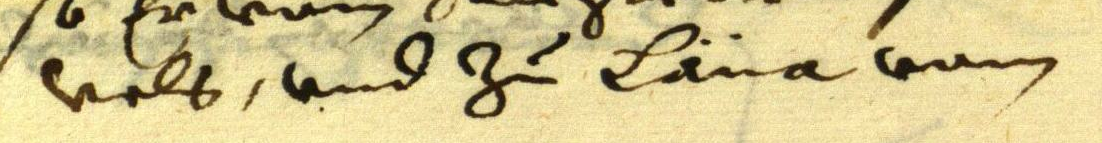vels, vnd Zū Läna vom
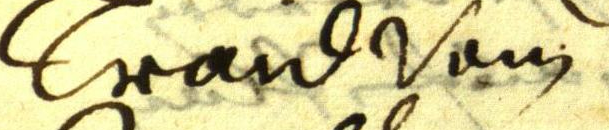Traid Vom
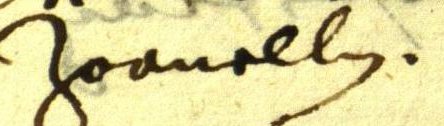Zoanelln.
